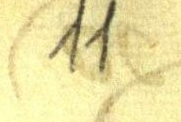11
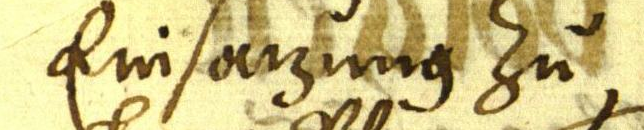Einsazūng Zū
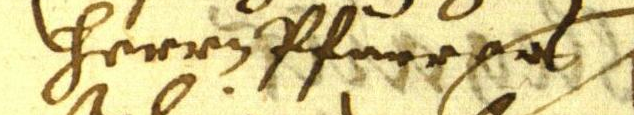herrn Pfarrers
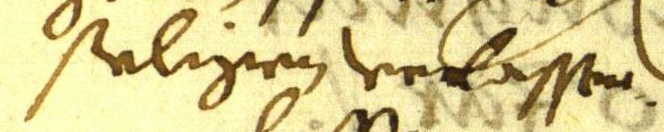seligen verlassen¬
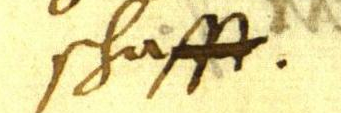schafft.
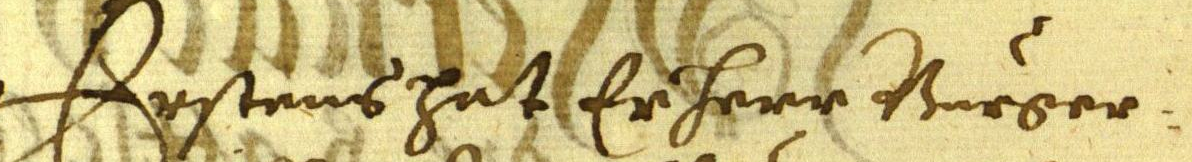Erstens hat Er herr Būrger¬
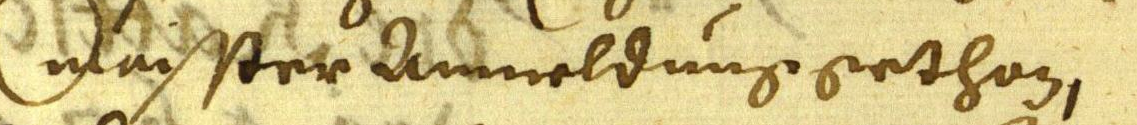maisster Anmeldūng gethan,
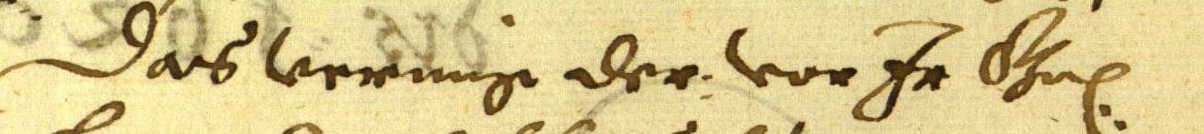das vermig der vor Ir Gn:
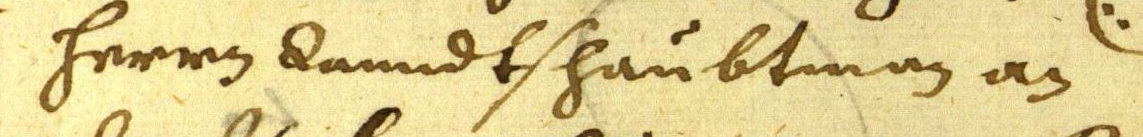herrn Lanndtshaūbtman an
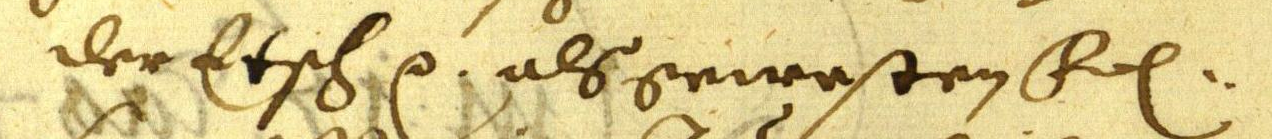der Etsch etc. als gewesten Frl:
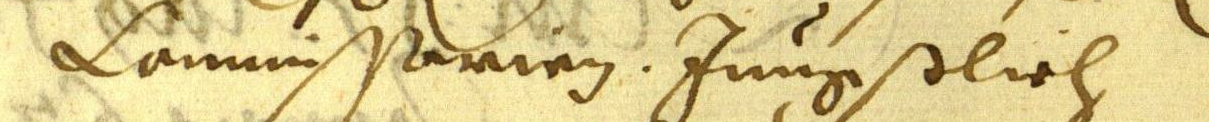Commissarien. Jūngstlich
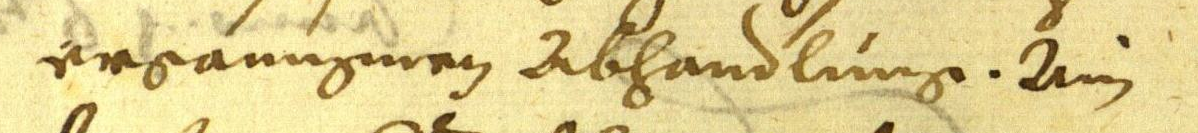erganngnen Abhandlūng. Ain
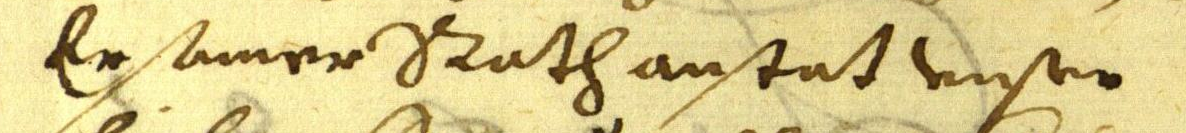Ersamer Rath anstat vnser
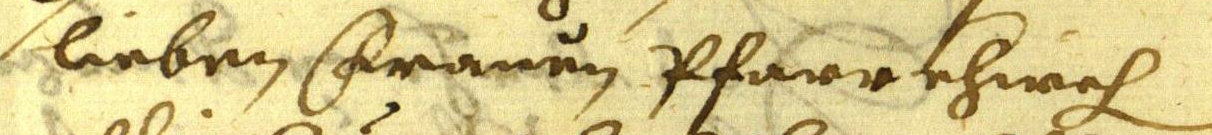lieben Fraūen Pfarrkhirch
